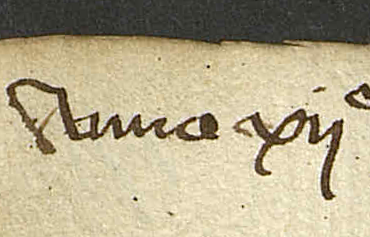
Anno xii*
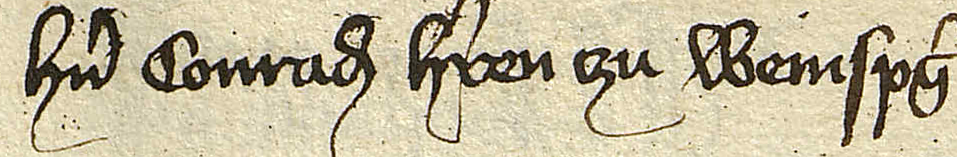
hn* Conrad* h*ren cʒu Weinſp*g
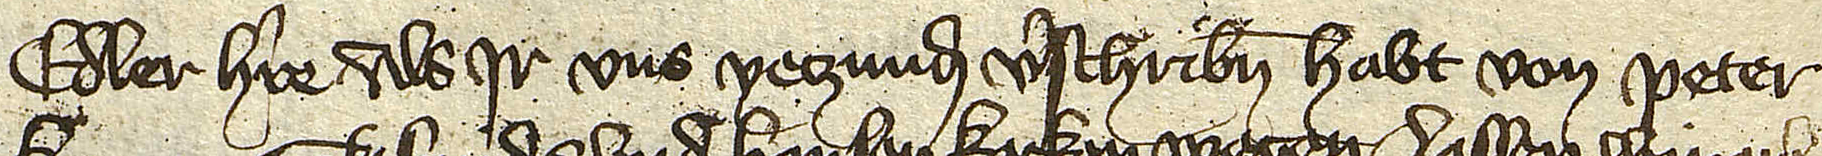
Edler h*re / Als Ir vns yecʒund* v*ſchribn* habt von Peter
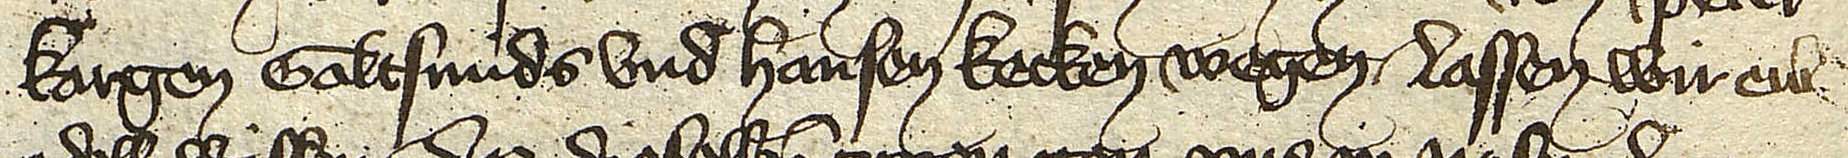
kargen Goltſmids vnd hanſen kecken wegen / laſſen wir ew*
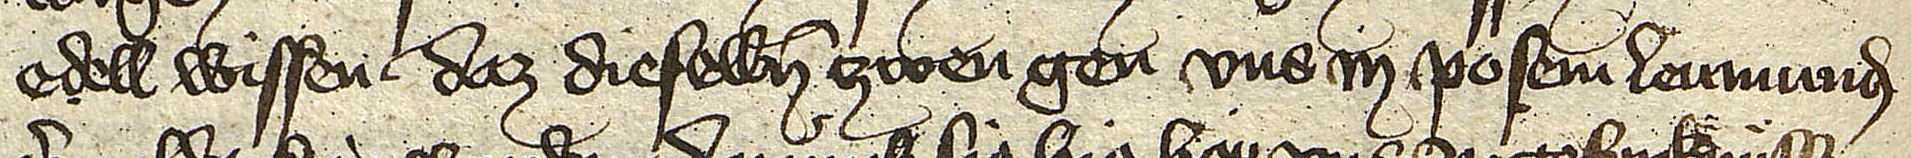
edell wiſſen / daʒ dieſelbn* cʒwen gen vns in poſem leumund*
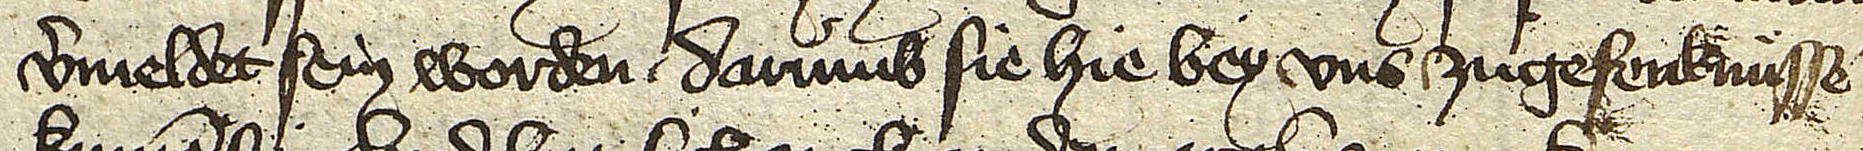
v*meldet ſein worden / darümb ſie hie bey vns cʒugefenknüſſe
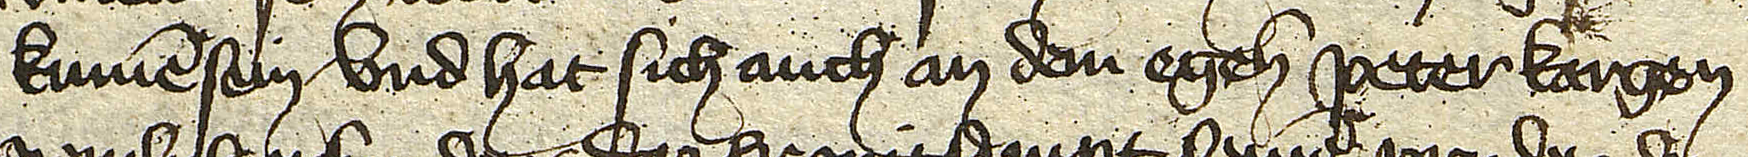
kume* ſein / vnd hat ſich auch an dem egen* Peter kargen
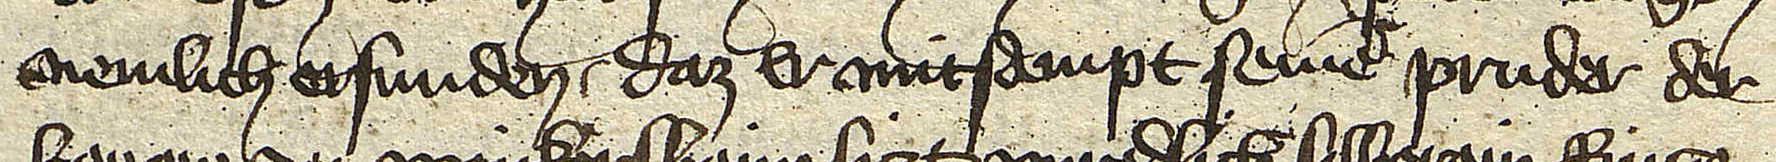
nemlch erfunden / daʒ Er mitſampt ſeine* pruder der
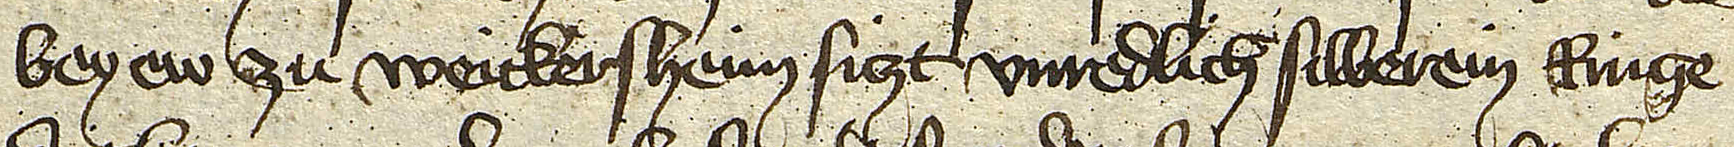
bey ew cʒu weickerſheim ſicʒt vnredlich ſilberein Ringe
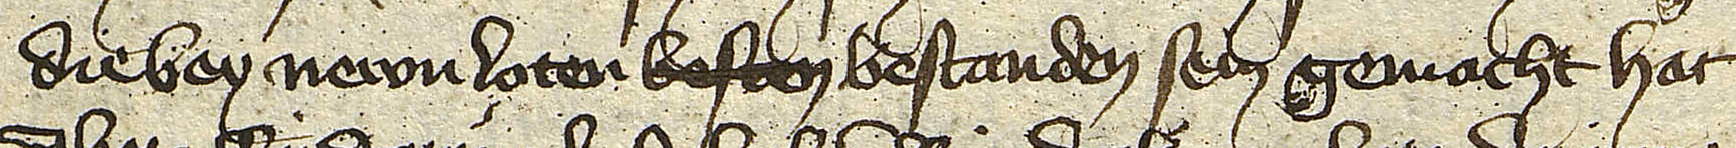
die bey newn loten beſten beſtanden ſein gemacht hat
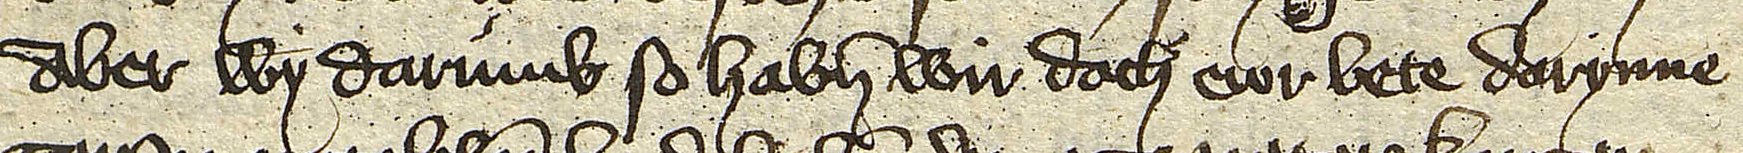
Aber wy darümb ſo habn* wir doch ewr bete darynne
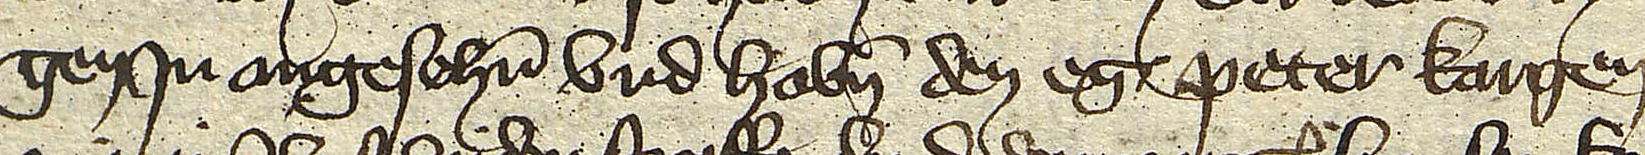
gen In angeſehn* vnd habn* den eg* Peter kargen
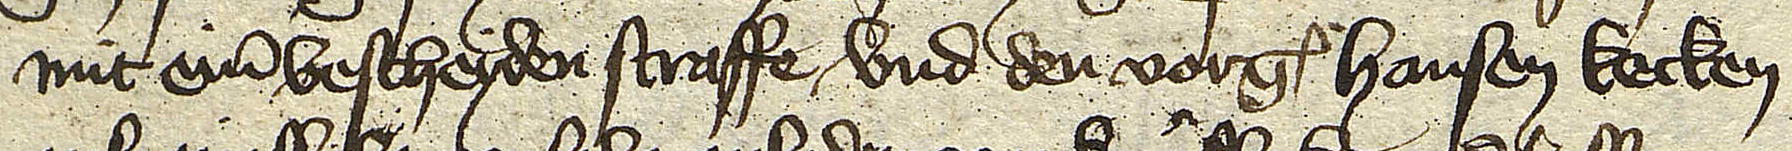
mit ein* beſcheyden ſtraffe / vnd den vorg* hanſen kecken
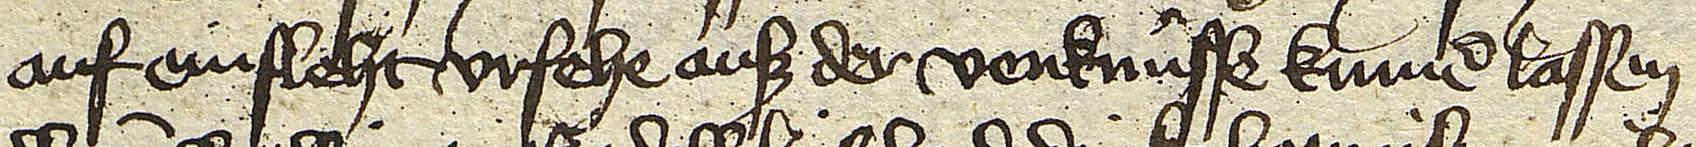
auf einfleht vrfehe auſʒ der venknüſſe kume* laſſen
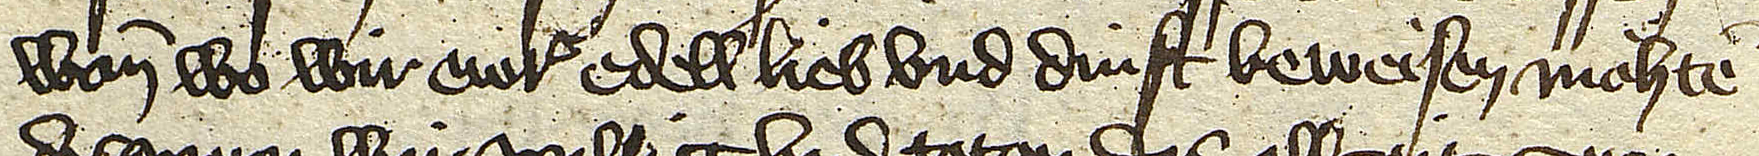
wan* wo wir ewr* edell lieb vnd dinſt beweiſen möhte*
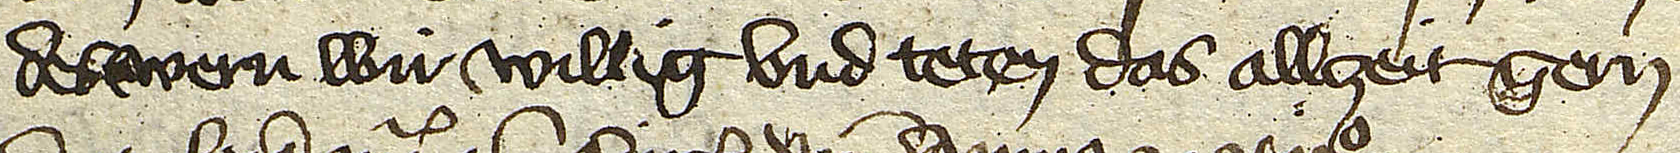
des wern wir willig vnd teten das allcʒeit gern
